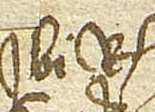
Ibi R*
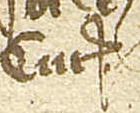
Cur* . /
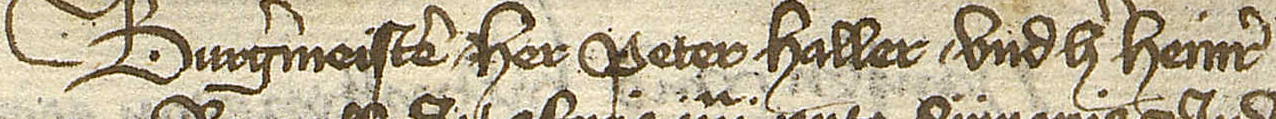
Burg*meiſte* / her Peter haller / vnd h* heinr*
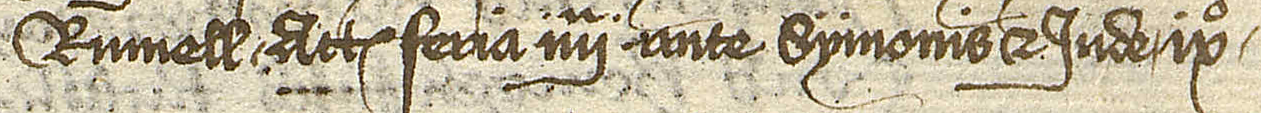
Rumell / Act* feria iiii* ante Symonis @ Iude ix* /
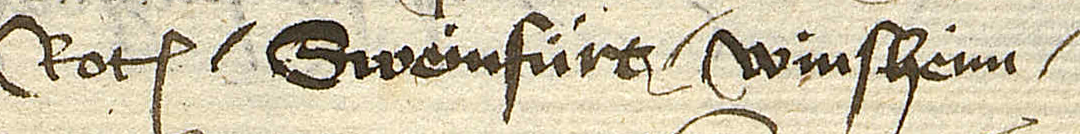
Rot* / Sweinfürt / winſheim /
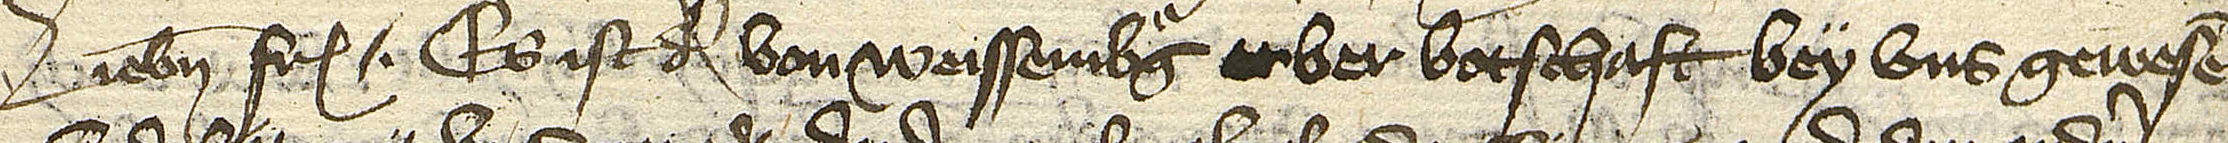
Liebn* fr* /. Es iſt d* von weiſſembg* erber botſchaft bey vns geweſe*
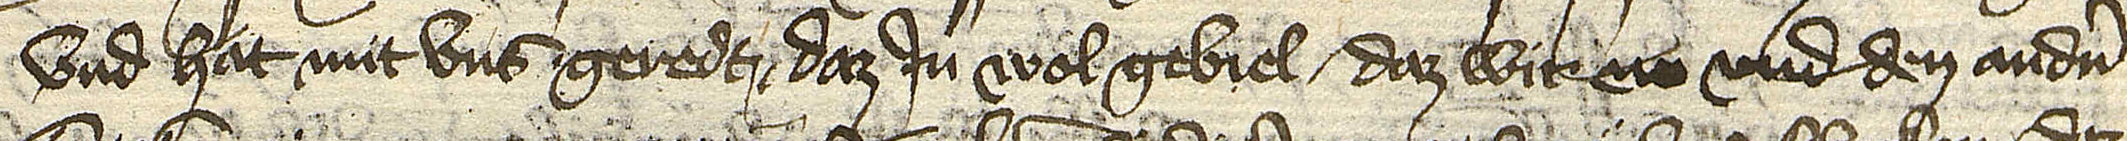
vnd hat mit vns geredt / daʒ In wol geviel / daʒ wir ew vnd den andn*
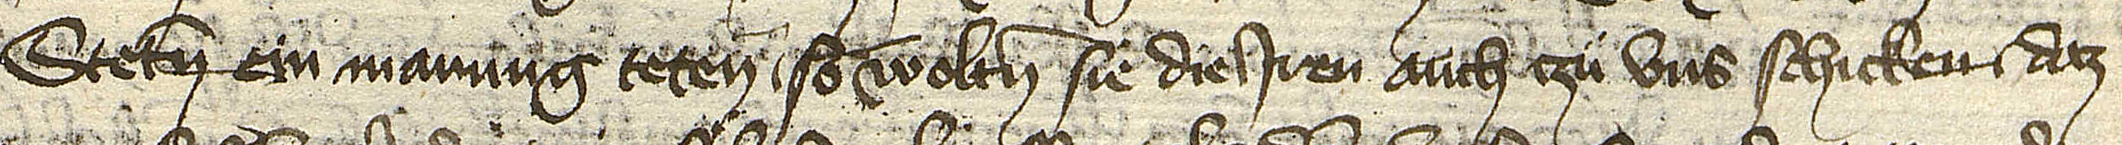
Stetn* ein manung teten / ſo woltn* ſie die Iren auch cʒü vns ſchicken / daʒ
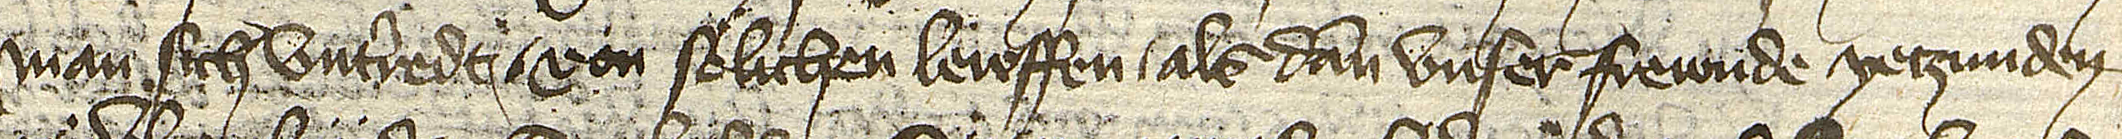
man ſich vnt*redt / von ſölichen lewffen / als dan* vnſer frewnde yetʒunden
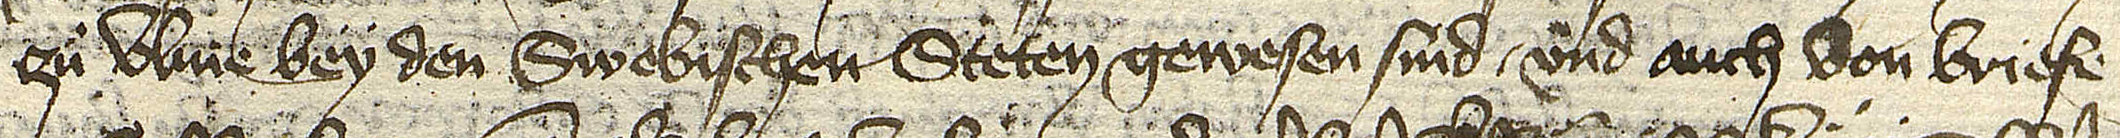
cʒü Vlme bey den Swebiſchen Steten geweſen ſind / vnd auch von briefe
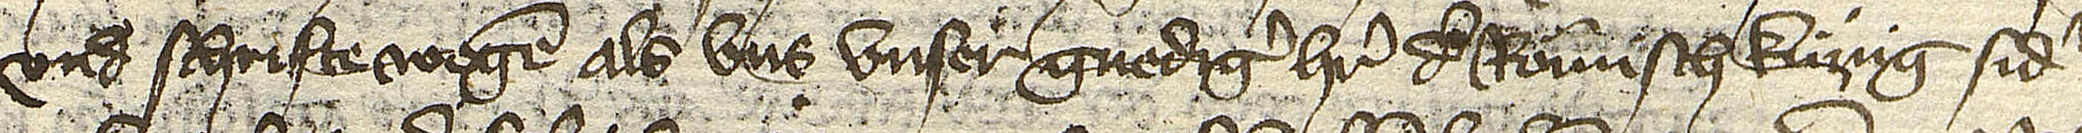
vnd ſchrifte wege* als vns vnſer gnedig* hr* d* Römisch künig ſid*
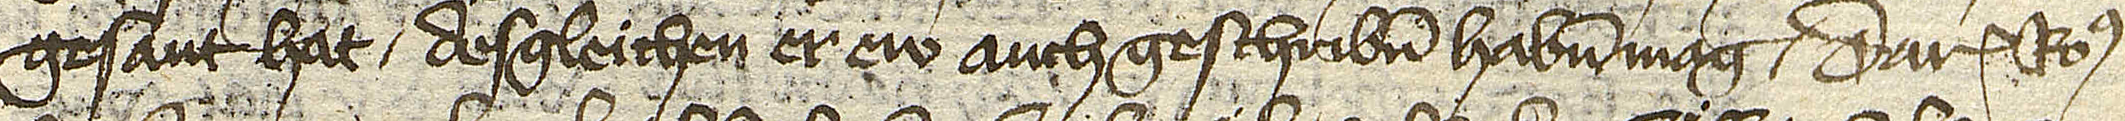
geſant hat / deſgleichen er ew auch geſchribn* habn* mag / Dar* Ro*
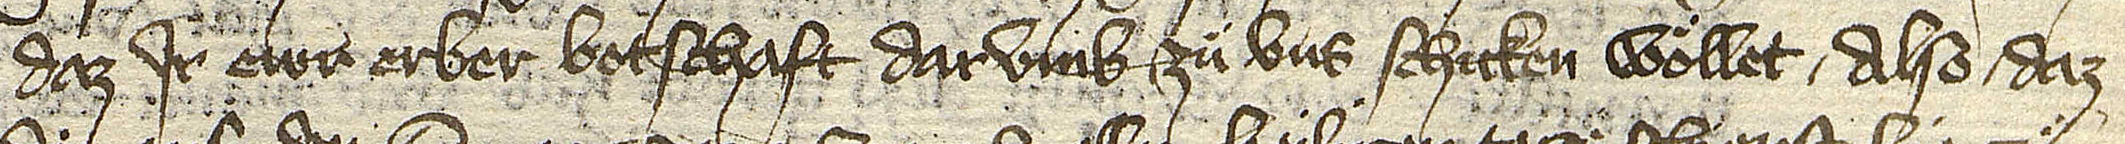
daʒ Ir ewr erber botſchaft darvmb cʒü vns ſchicken wöllet / Alſo / daʒ
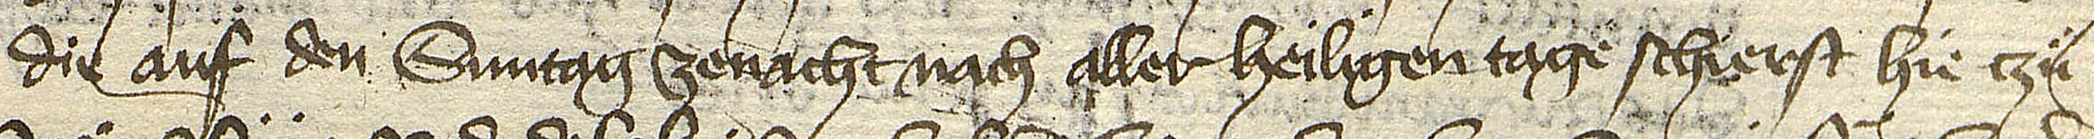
die auf den Suntag cʒenacht nach aller heiligen tage ſchierſt hie cʒü
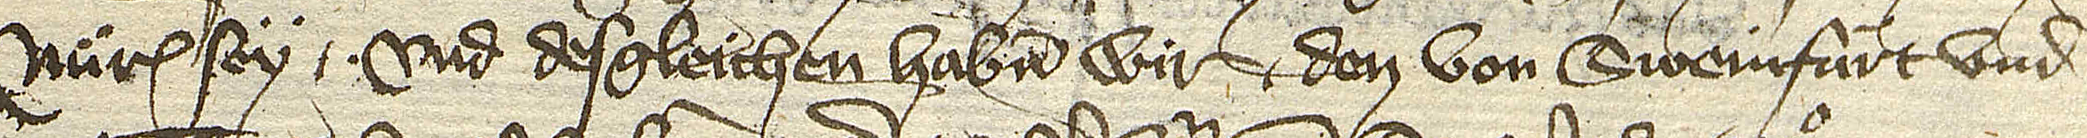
Nür* ſey / . vnd deſgleichen habn* wir / den von Sweinfurt vnd
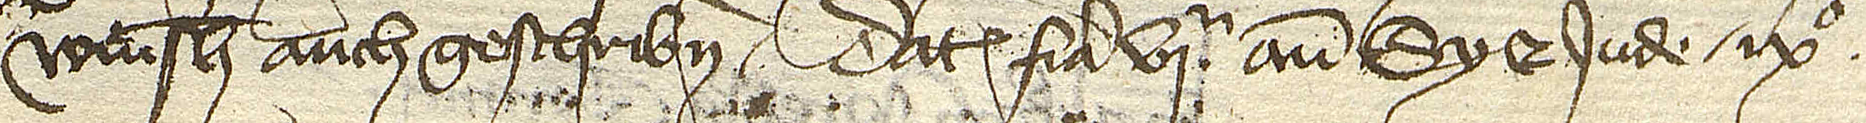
winſh* auch geſchribn* / Dat* fia* vi* . An* Sy @ Iude / ix* .
